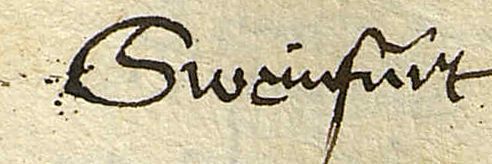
Sweinfürt
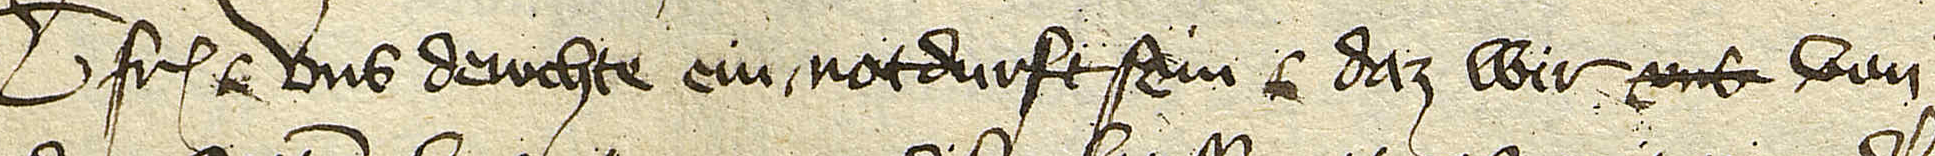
L* fr* / Vns dewchte ein notdurft ſein / daʒ wir vns von
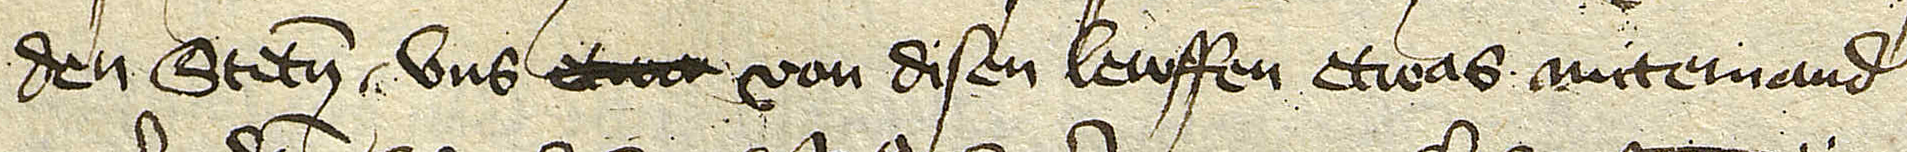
den Stetn* / vns etwa von diſen lewffen etwas miteinand*
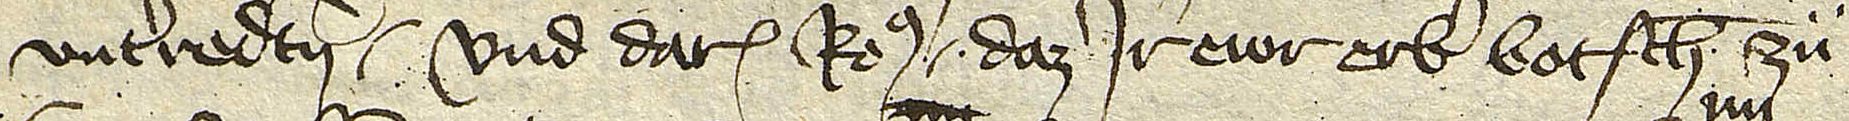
vnt*redtn* / vnd dar* Ro* / . daʒ Ir ewr erb* botſch* cʒü
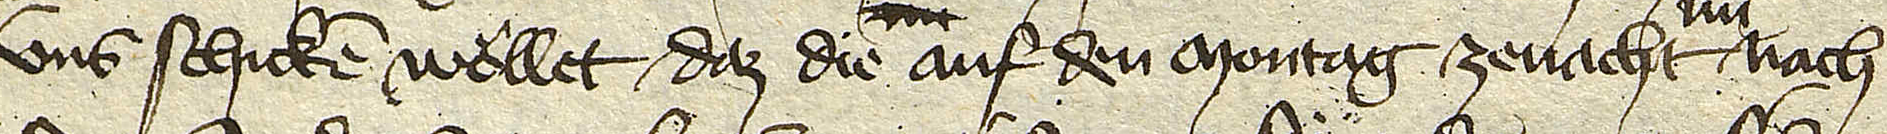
vns ſchicke* wöllet / daʒ die auf den Montag cʒenacht nach
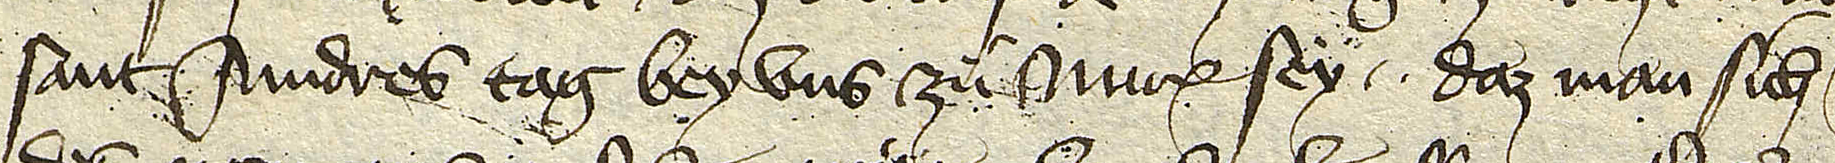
ſant Andres tag bey vns cʒü Nur* ſey / . daʒ man ſich
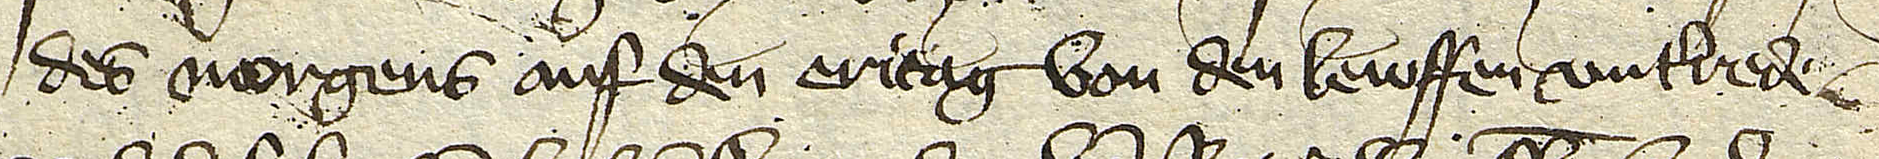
des morgens auf den eritag von den lewffen vnt*rede /
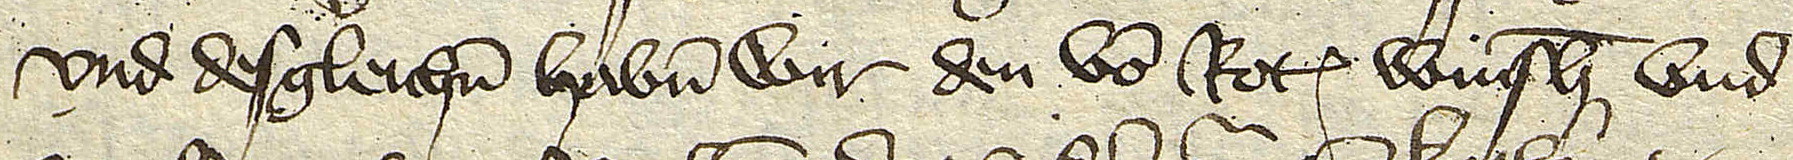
vnd deſgleichn* habn* wir den vo* Rot* winſh* vnd
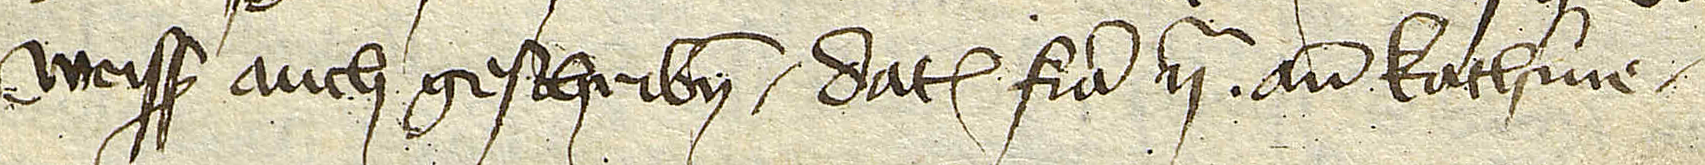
weiſſ* auch geſchribn* / dat* fia* ii* . an* kath*ine /
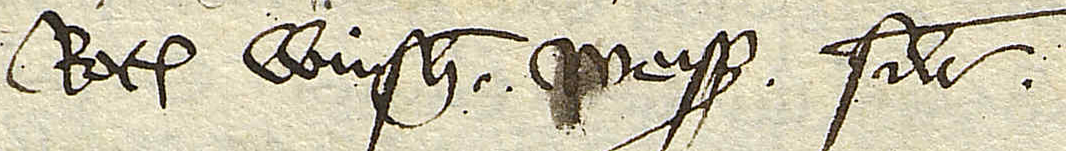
Rot* winſh*. weiſſ*. ſilr*.
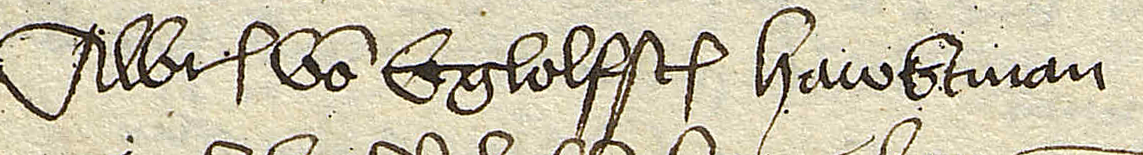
Albr* vo* Eglolfſt* hawbtman
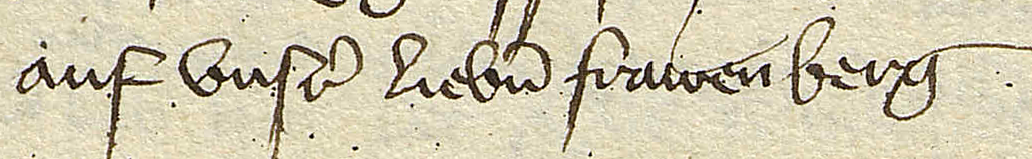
auf vnſr* liebn* frawenberg
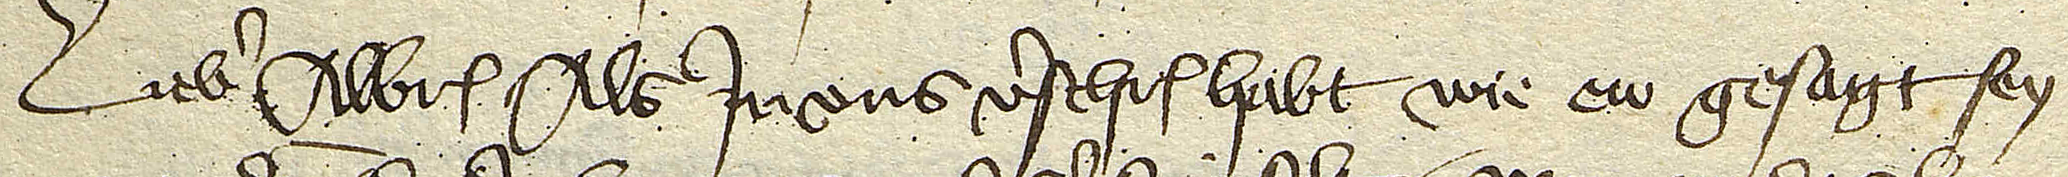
Lieb* Albr* / Als Ir vns v*ſchr* habt wie ew geſagt ſey
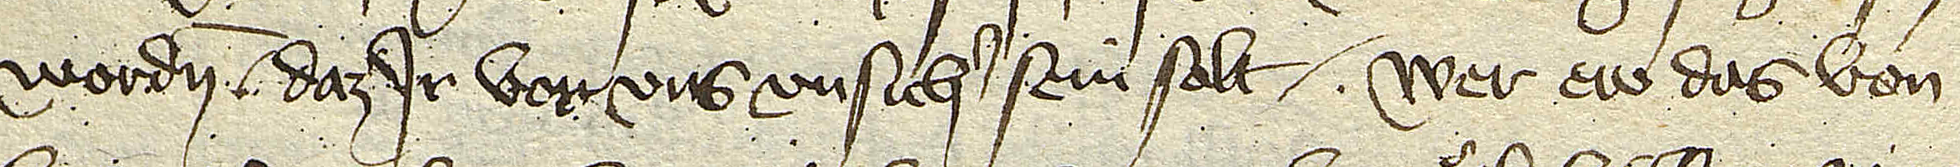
wordn* / daʒ Ir von vns vnſich* ſein ſolt / . wer ew das von
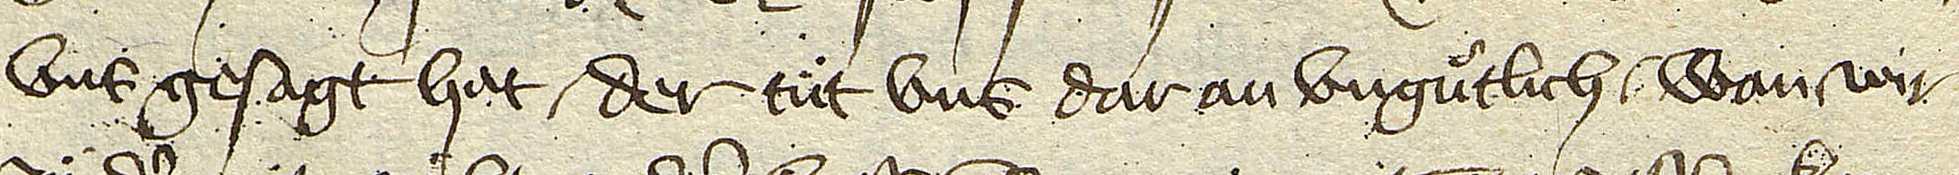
vns geſagt hat / der tüt vns dar an vngütlich / wan wir
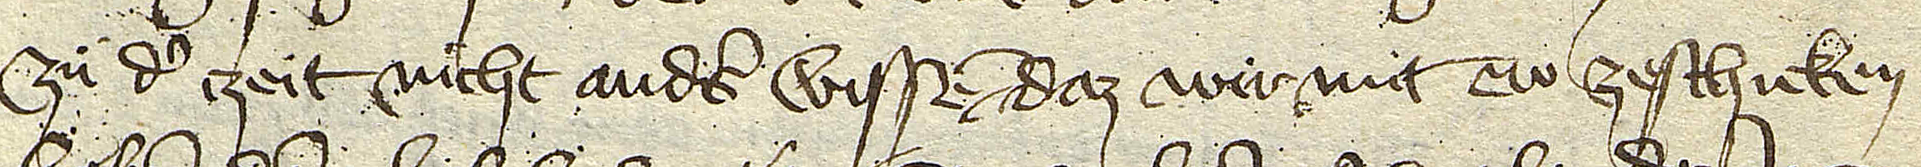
cʒü d* cʒeit nicht ands* wiſſe* / daʒ wir mit ew cʒeſchicken
